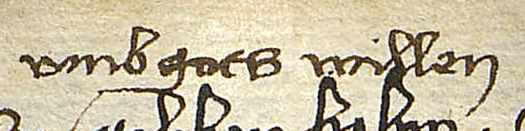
vmb gots willen
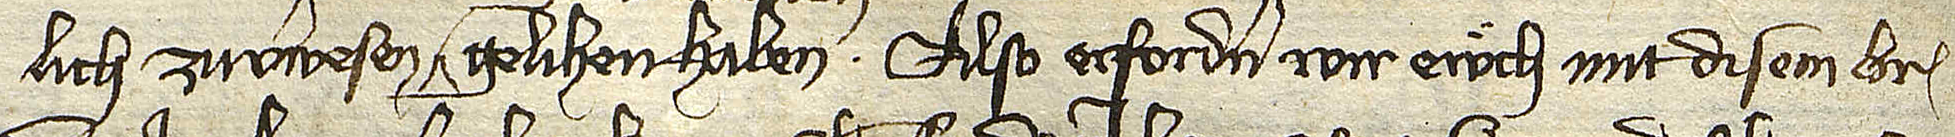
- lich ʒuv*weſen gelihen haben . Alſo erford*n wir ewch mit diſem br*
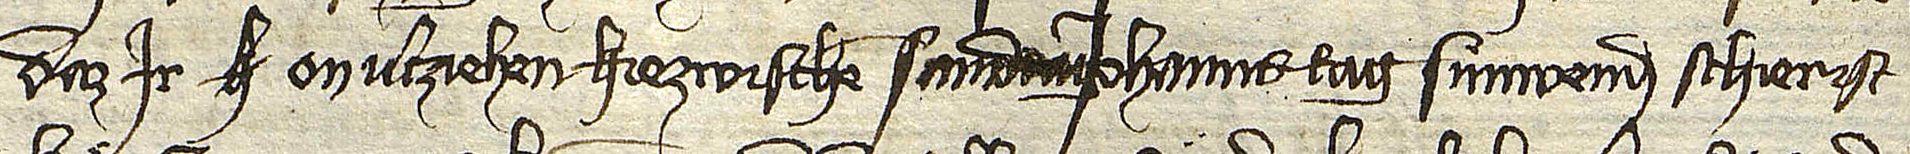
daʒ Ir h on u*cʒiehen hieʒwiſche* ſandtag Iohanns tag ſünwend* ſchieriſt
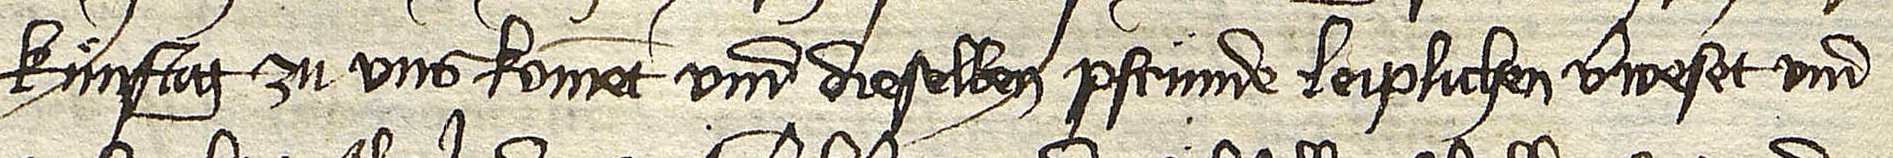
künftig ʒu vns komet* vnd dieſelben pfründe leiplichen v*weſet vnd
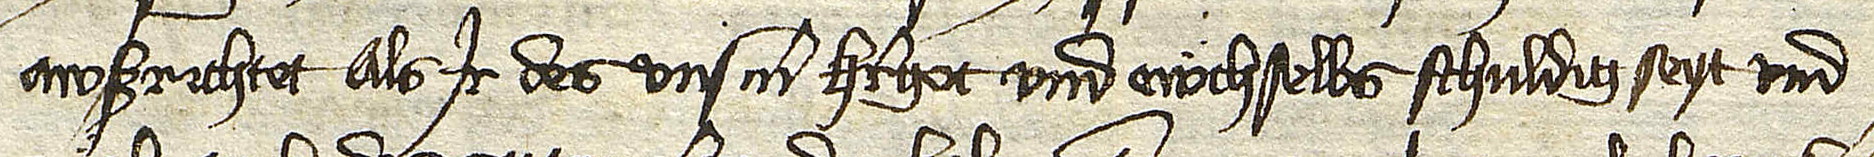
awſʒrichtet als Ir des vnſ*m h*rgot vnd ewchſelbs ſchuldig ſeyt vnd
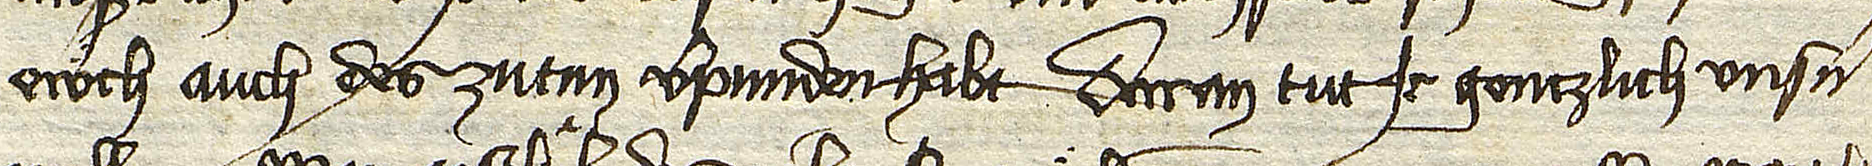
ewch auch des ʒutun v*punden habt Daran tut Ir gencʒlich vnſ*n
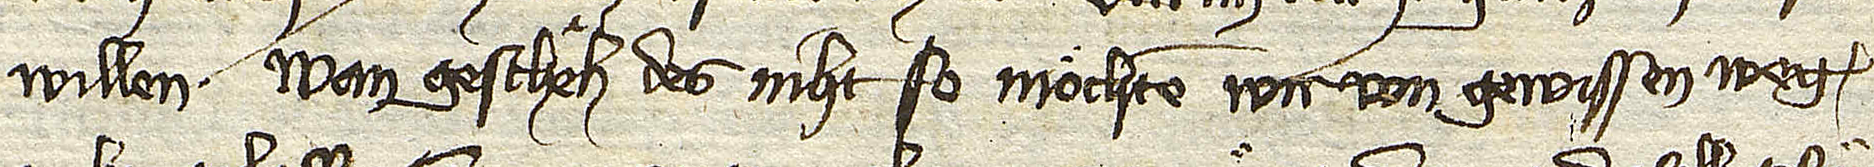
willen . Wan geſchëh des niht ſo möchte* wir von gewiſſen weg*
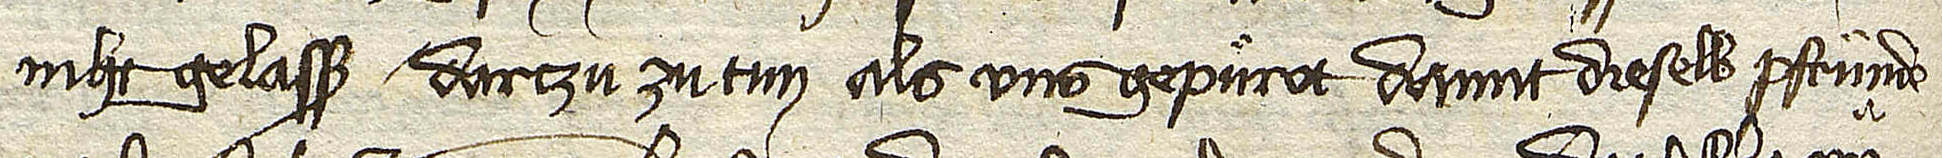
niht gelaſſ* / darcʒu ʒu tun als vns gepürot damit dieſelb pfründe
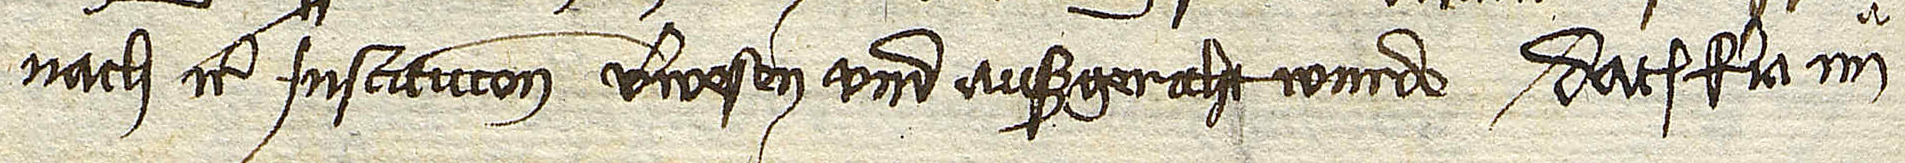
nach ir* inſtituc*on v*weſen vnd auſʒgericht wurde / Dat* fia iiii*
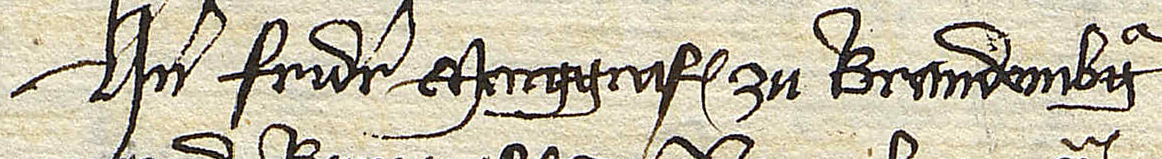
H*n Fridr* Marggraf* ʒu Brandemb*g
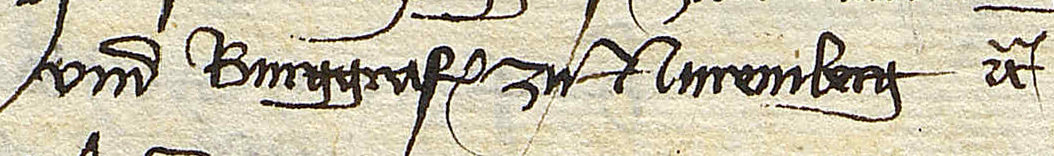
vnd Burggraf* ʒu Nuremberg ec*
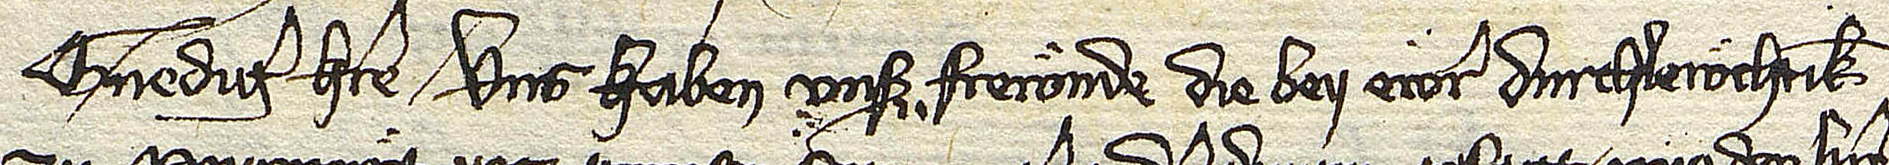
Gnedig* h*re / Vns haben vnſ* ~ frewnde die bey ew*r durchlewchtik*
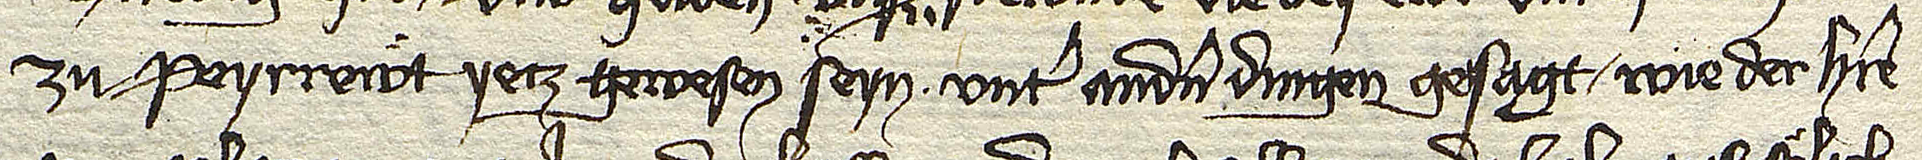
ʒu Peyrrewt yecʒ geweſen ſeyn . vnt* and*n dingen geſagt / wie der h*re
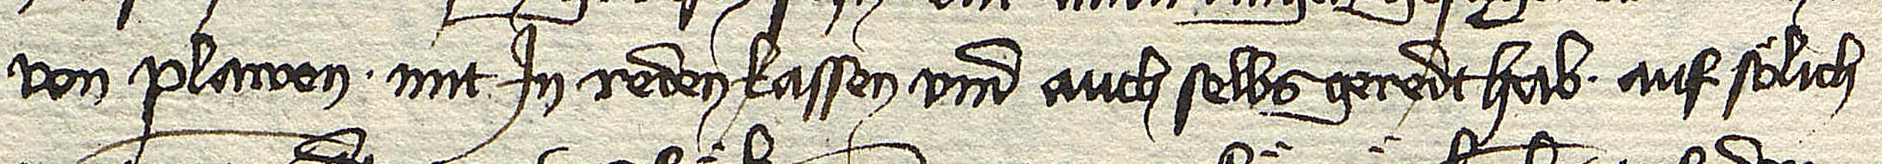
von plawen . mit In reden laſſen vnd auch ſelbs geredt hab . auf ſölich
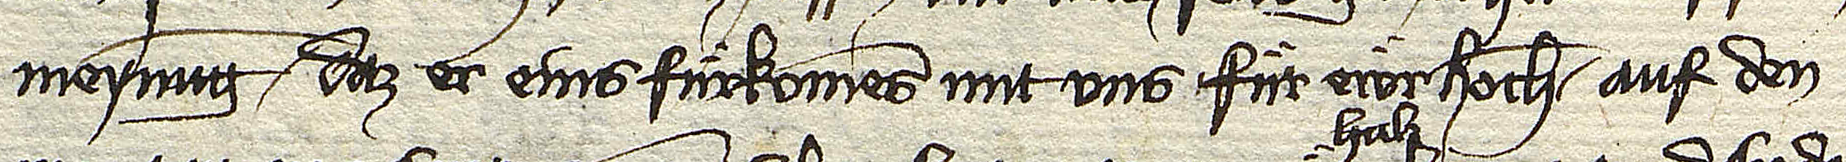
meynu*g / daʒ er eins fürkomes* mit vns für ewr hoch* / auf den
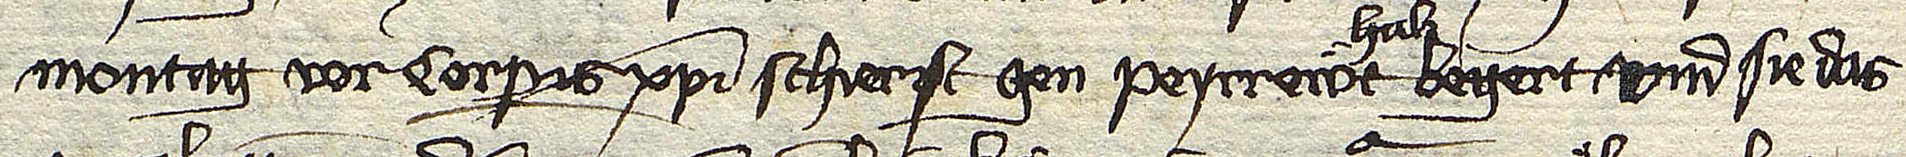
montag vor Corp*is xpi* ſchieriſt gen peyrrewt begert vnd ſie das
